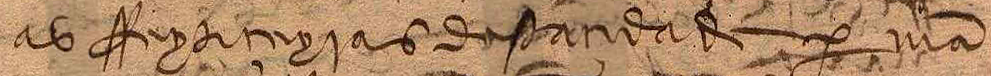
as ffejticeyras desta cidade ꝑ mā
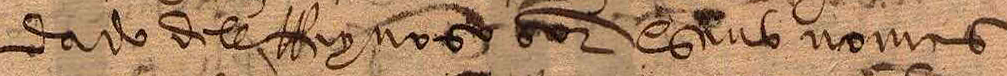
dado dell Rey noso s̄or e seus nomes
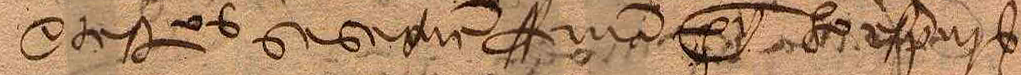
e testos se seguē ffernā p̄iz ho esp̄uj
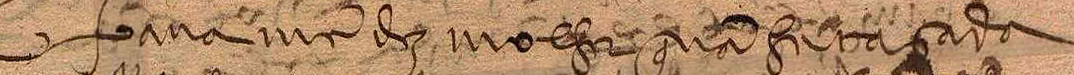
item Joana mēdez molher q̄ nā he casada
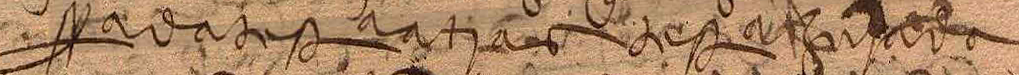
ffa da testa atras testa Jurada
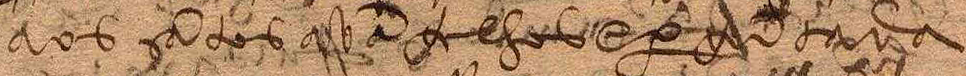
aos sātos avāgelhos e ꝑgūtada
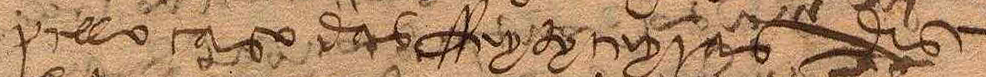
pello caso das ffeytyceyras dise
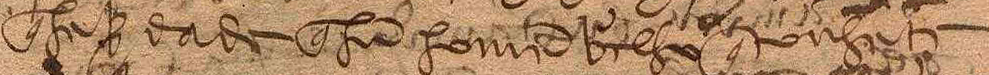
q̄ he ꝟdade q̄ hū homē velho q̄ conhece
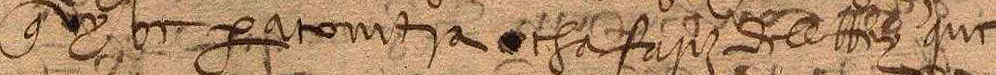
q̄ vyve ꝑa comtra o chafariz dell Rey que
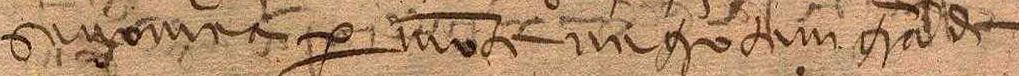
se nomea ꝑ mōtenegro tem grāde
